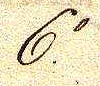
6.o
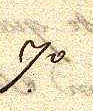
7.o
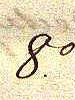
8.o
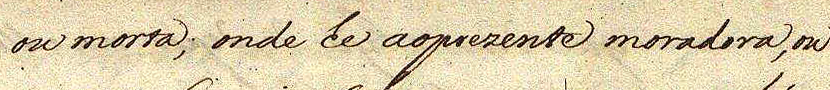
ou morta; onde he ao prezente moradora, ou
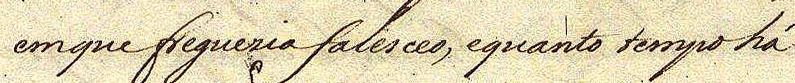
em que freguezia falesceo, e quanto tempo há
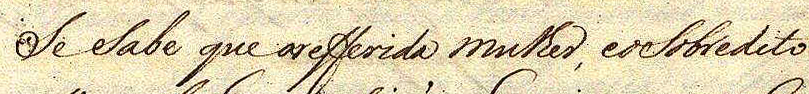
Se Sabe que a refferida mulher, e o Sobredito
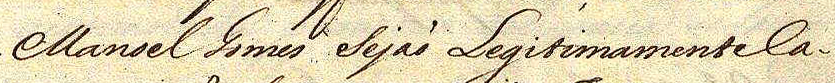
Manoel Gomes Sejaõ Legitimamente Ca
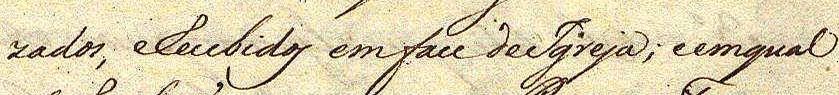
zados, e Recebidos em face de Igreja; e em qual
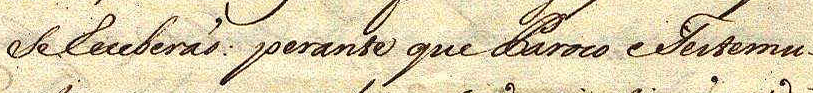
Se Receberaõ: perante que Paroco e Testemu
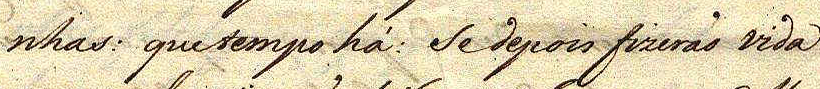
nhas: que tempo há: se depois fizeraõ vida
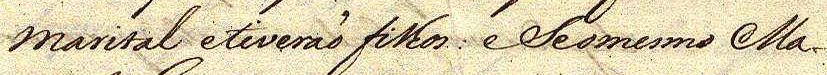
marital, e tiveraõ filhos: e Se o mesmo Ma
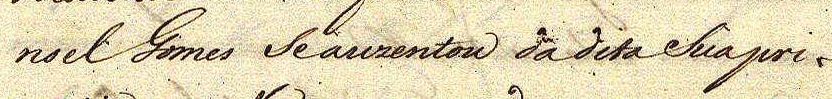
noel Gomes Se auzentou da dita Sua pri
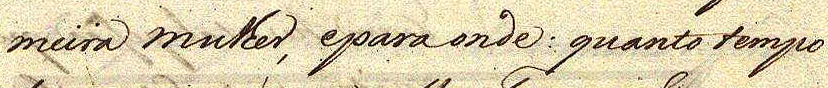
meira mulher, e para onde: quanto tempo
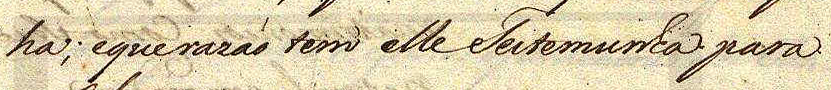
ha; e que razaõ tem elle Testemunha para
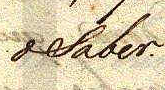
o Saber.
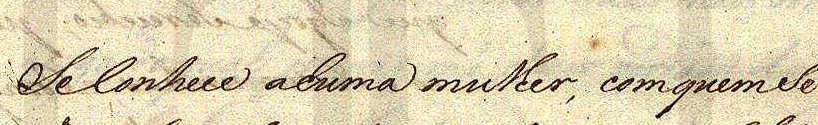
Se Conhece a huma mulher, com quem se
